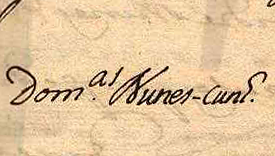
Dom.as Nunes- cunh.
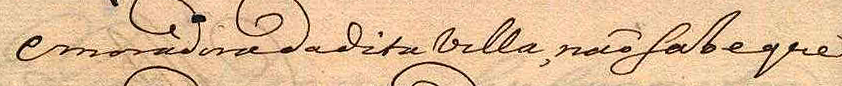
e moradora da dita villa, naõ sabe que
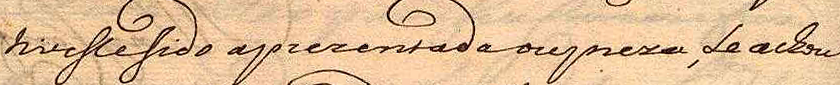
tivesse sido aprezentada ou preza, se achou
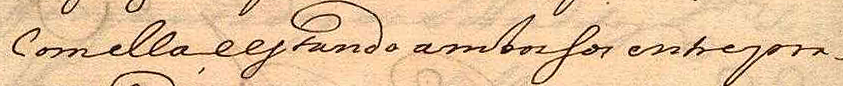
Com ella, e estando amboz sos entre pra
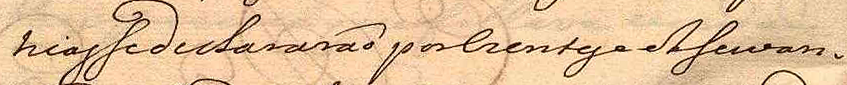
ticas se desclararaõ por Crentes e observan
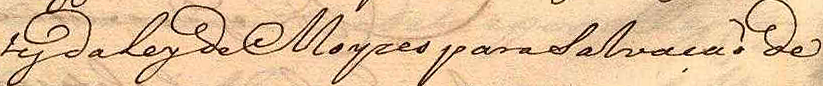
tes da Ley de Moyzes para Salvaçaõ de
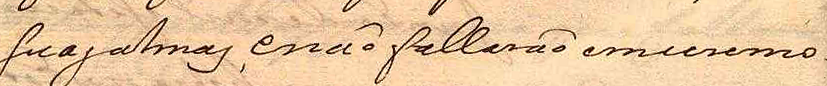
suas almas, e naõ fallaraõ em ceremo
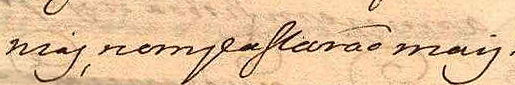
nias, nem passaraõ mais.
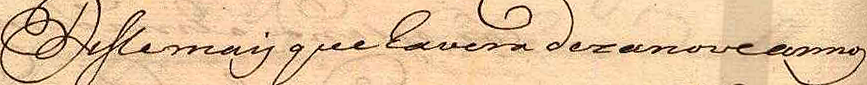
Disse que havera dezanove annos
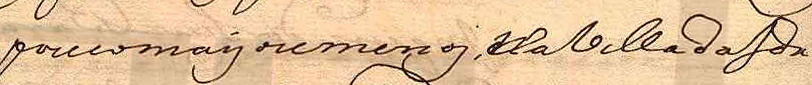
pouco mais ou menos, na Villa da Jda
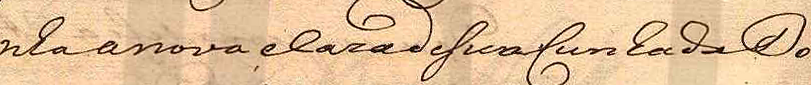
nha a nova, e Caza de sua Cunhada Do
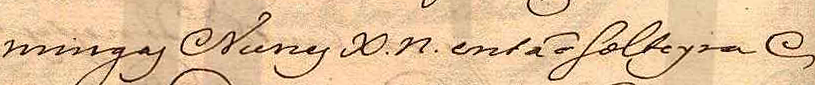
mingas Nunes x.n. entaõ solteyra E
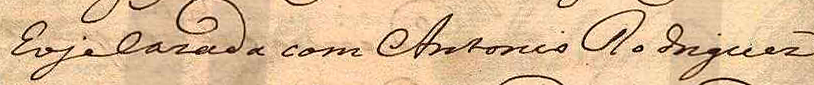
hoje Cazada com Antonio Rodriguez
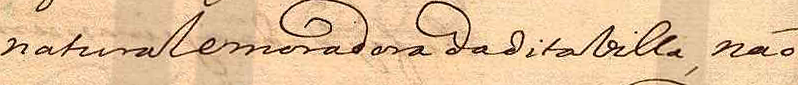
natural e moradora da dita villa, naõ
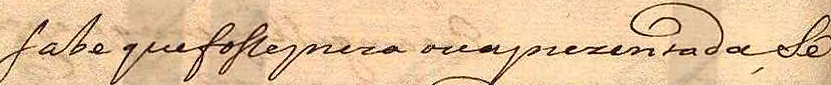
sabe que fosse preza ou aprezentada, Se
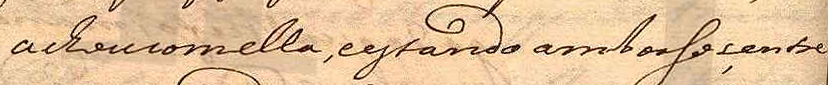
achou com ella, e estando ambos sos, entre
